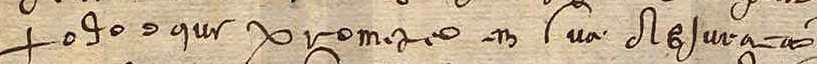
todo o que prometeo em sua Abjuraçaõ
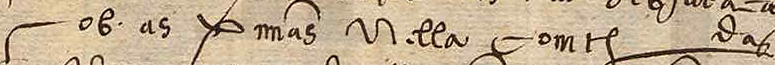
sob as pnnās nella comthdas
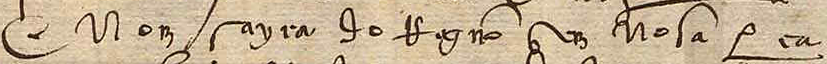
e nom sayra do Regno sem nosa Lça
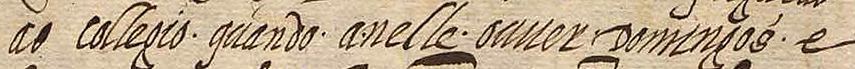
ao collegio quando a nelle ouuer Domingos e
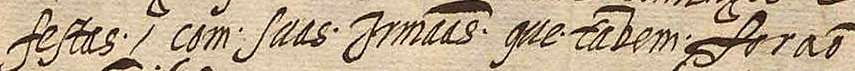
festas / com suas Jrmāas que tābem foraõ
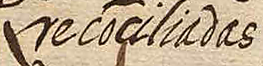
recōciliadas
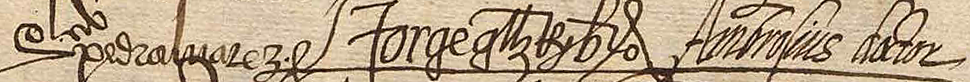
Ldo pedraluarez Jorge ḡllz Rybro Ambrosius doctor
